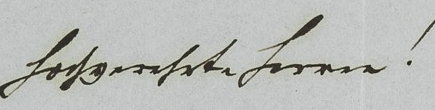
Hochverehrte Herren!
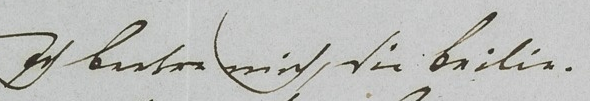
Ich beehre mich, die beilie-
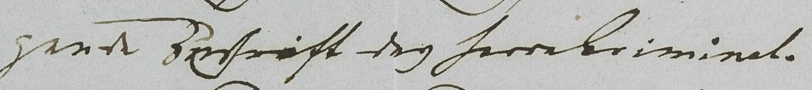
gende Zuschrift des Herrn Criminal-
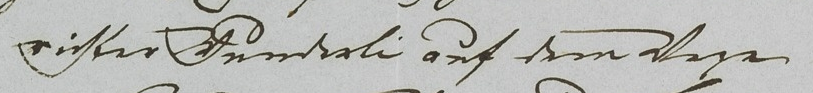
richter Wunderli auf dem Wege
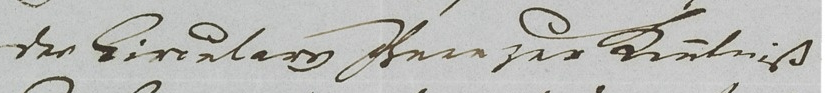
des Circulars Ihnen zur Kenntniß
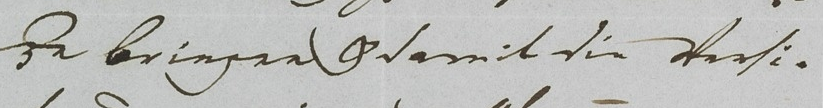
zu bringen & damit die Versi-
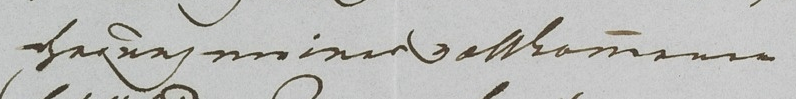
cherung meiner vollkommenen
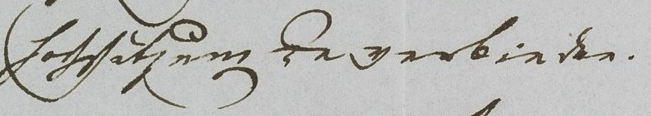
Hochachtung zu verbinden.
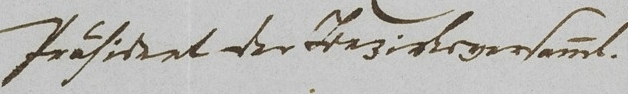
Präsident der Bezirksversamml.
